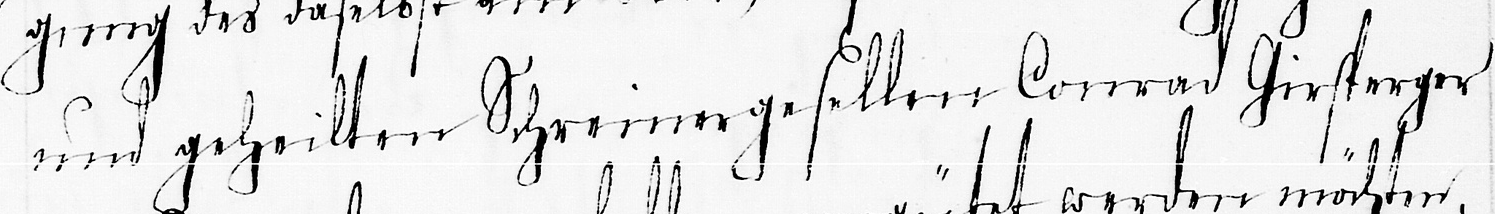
und geheilten Schreinergesellen Conrad Girsperger
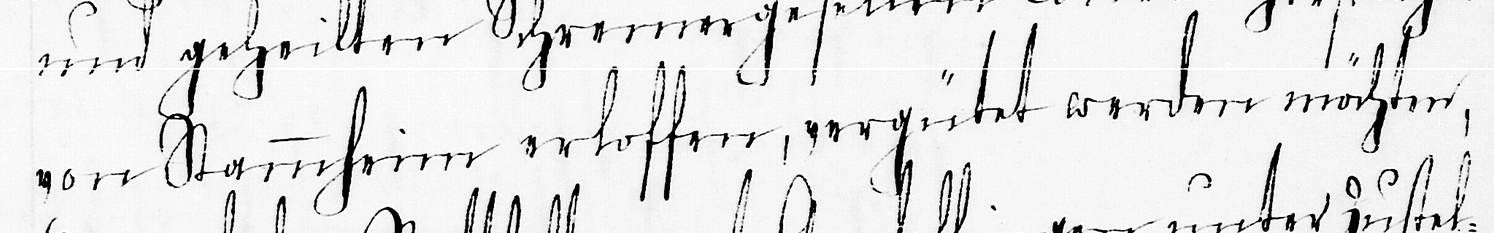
von Stammheim erloffen, vergütet werden möchten,
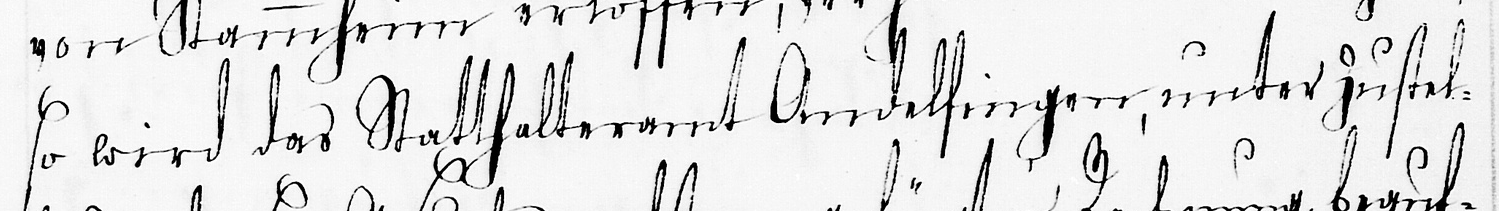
so wird das Statthalteramt Andelfingen, unter Zustel¬
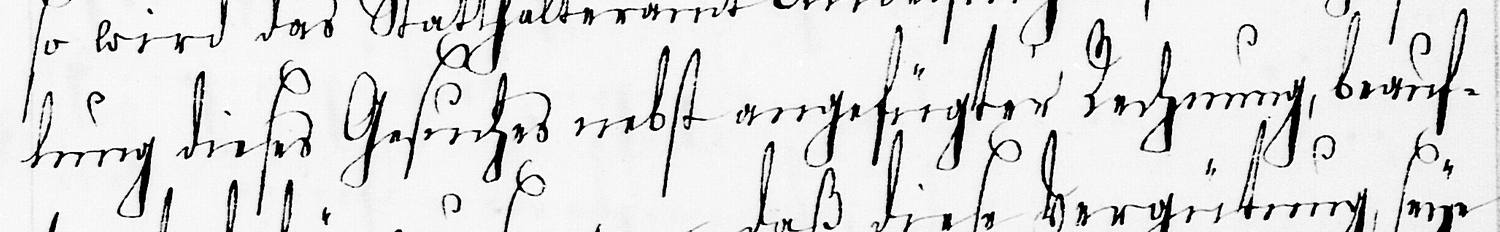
lung dieses Gesuches nebst angefügter Rechnung, beauf¬
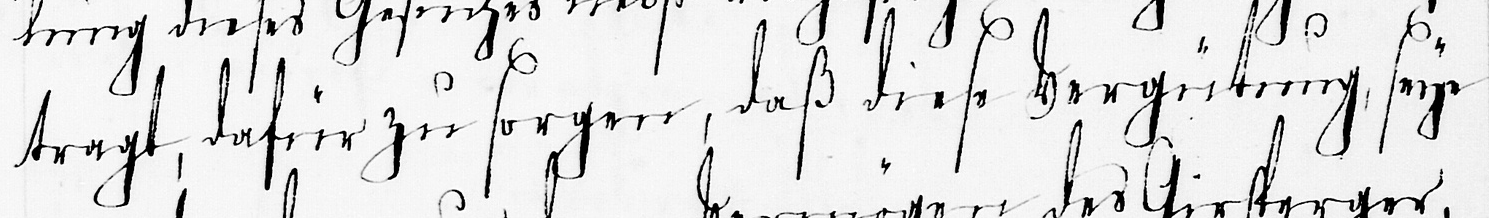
tragt, dafür zu sorgen, daß diese Vergütung, seye
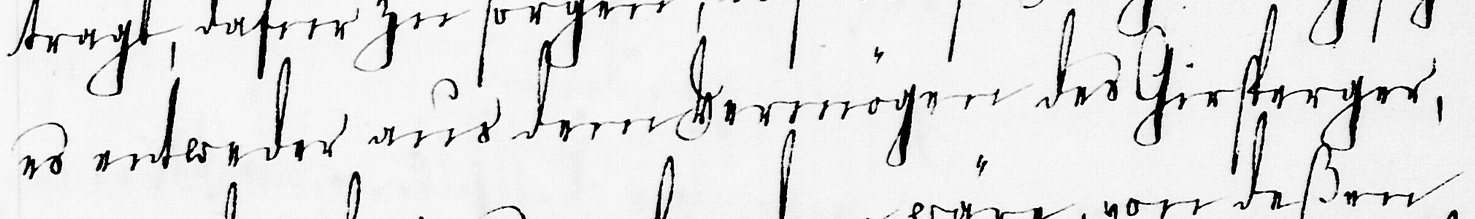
es entweder aus dem Vermögen des Girsperger,
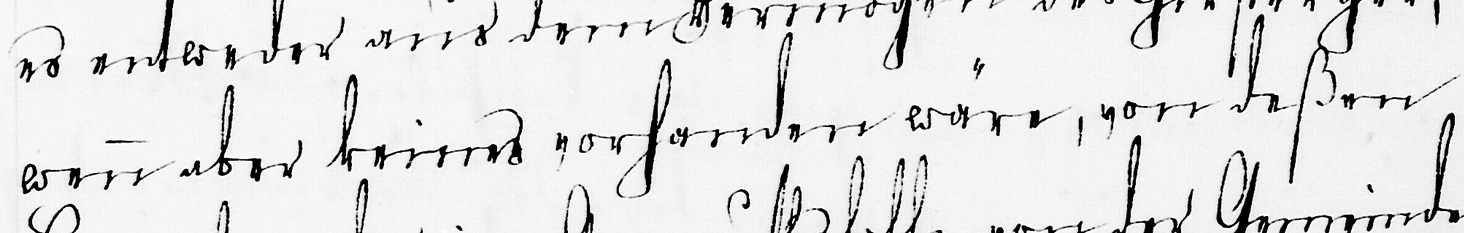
wenn aber keines vorhanden wäre, von deßen
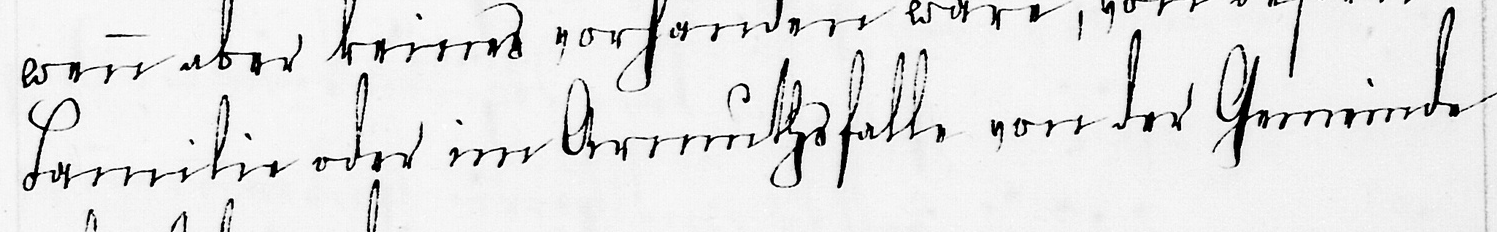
Familie oder im Armuthsfalle von der Gemeinde
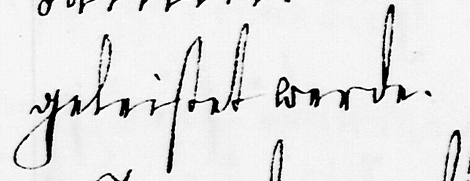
geleistet werde.
